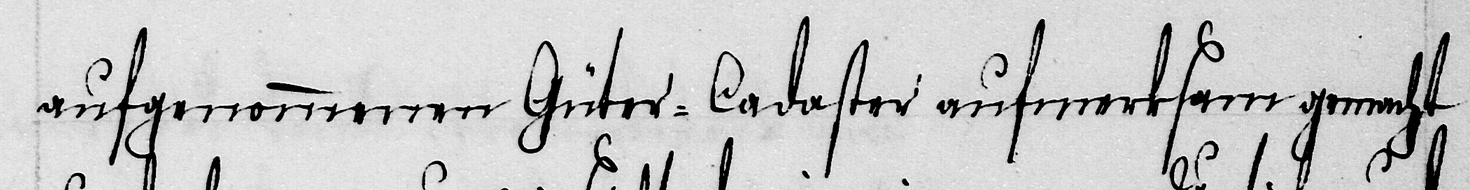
aufgenommenen Güter-Cadaster aufmerksam gemacht
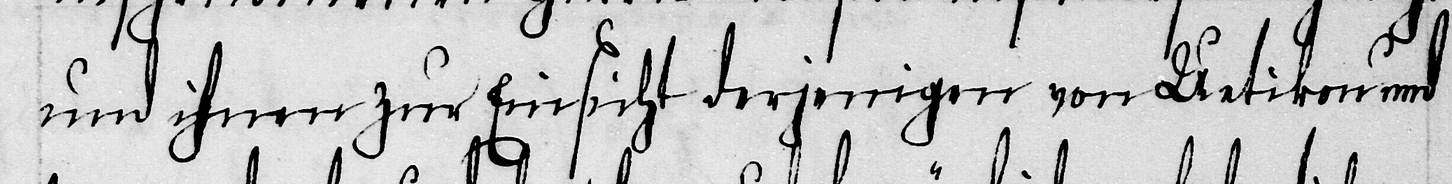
und ihnen zur Einsicht derjenigen von Uetikon und
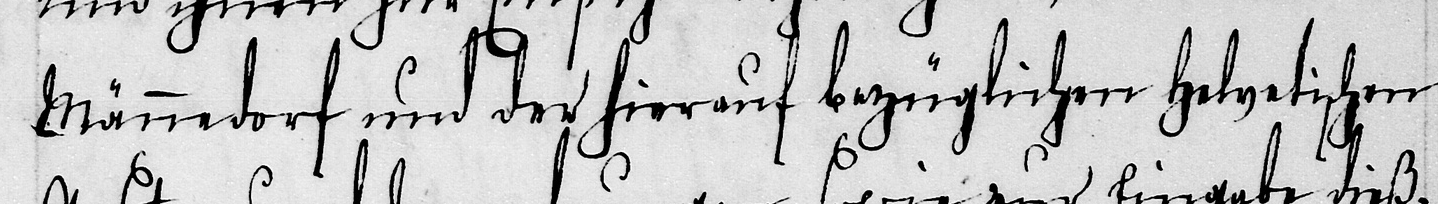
Männedorf und der hierauf bezüglichen helvetischen
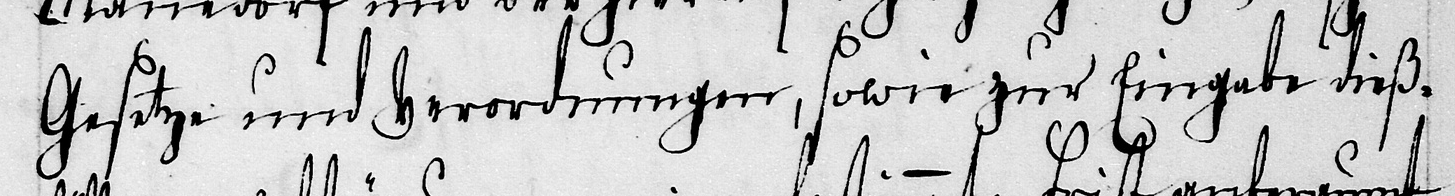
Gesetze und Verordnungen, sowie zur Eingabe dieß¬
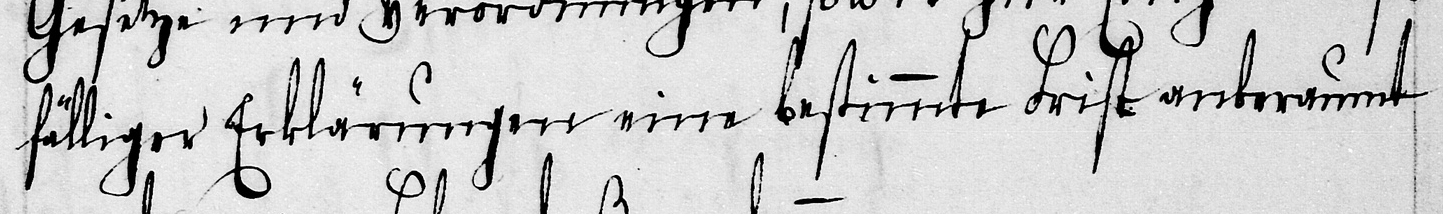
fälliger Erklärungen eine bestimmte Frist anberaumt
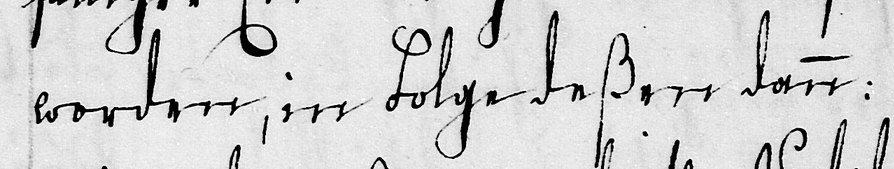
worden, in Folge deßen dann:
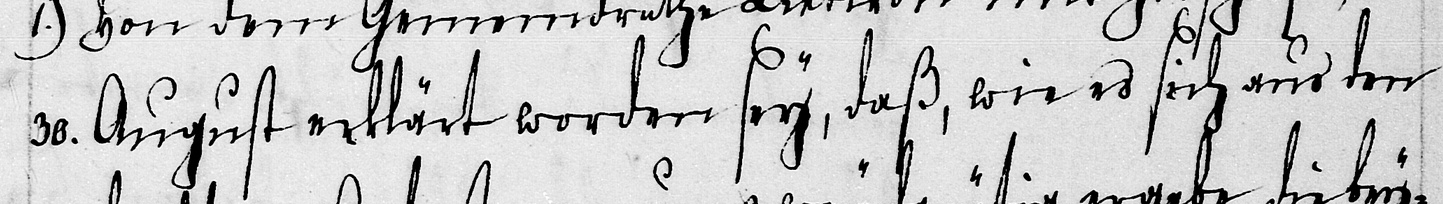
30. August erklärt worden sey, daß, wie es sich aus den
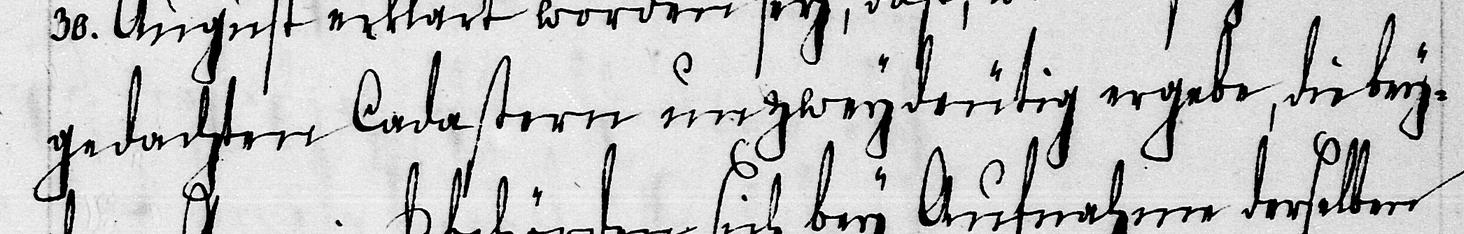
gedachten Cadastern unzweydeutig ergebe, die bey¬
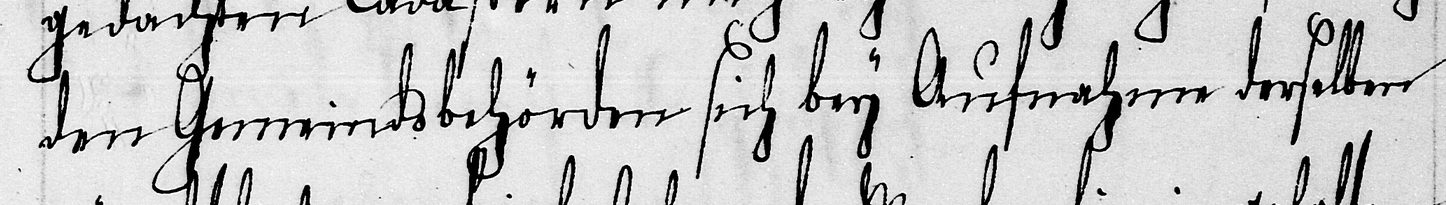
den Gemeindsbehörden sich bey Aufnahme derselben
